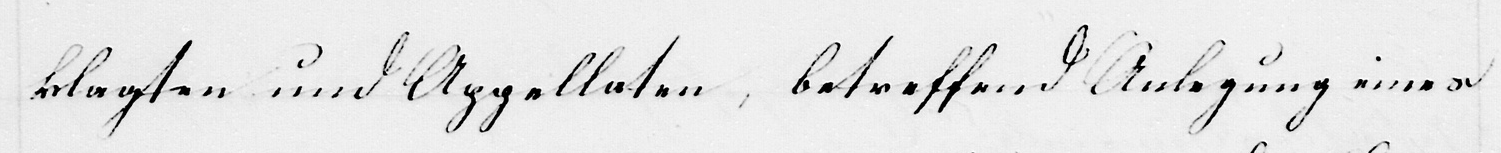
klagten und Appellaten, betreffend Anlegung eines
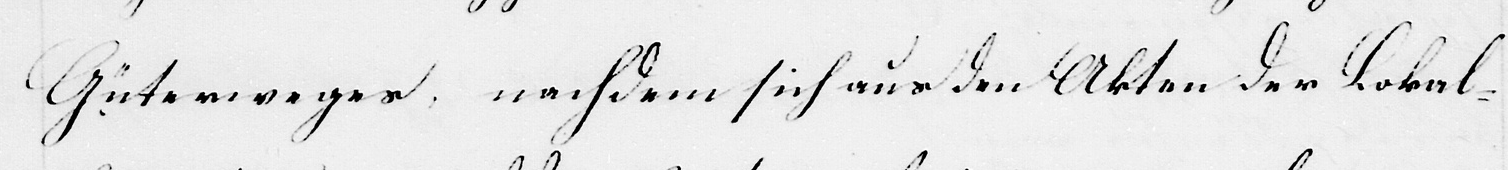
Güterweges, nachdem sich aus den Akten der Lokal¬
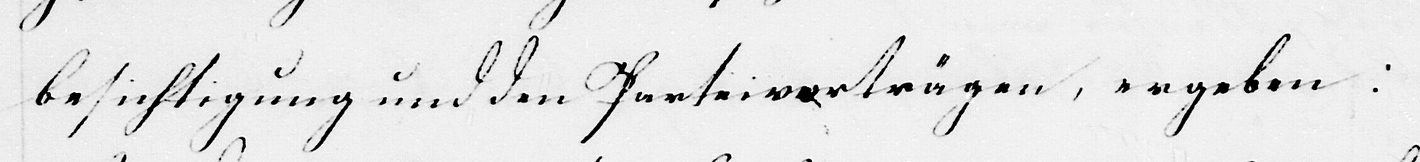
besichtigung und den Parteivorträgen, ergeben:
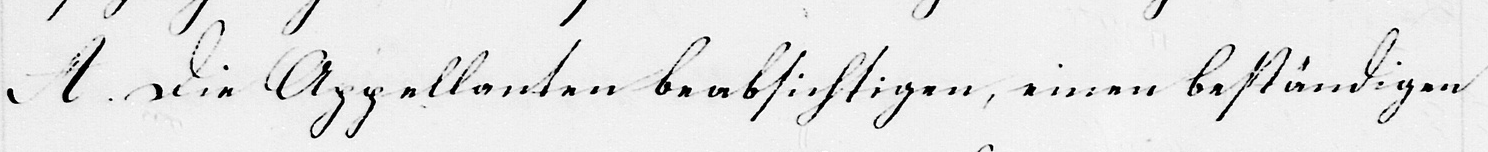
A. Die Appellanten beabsichtigen, einen beständigen
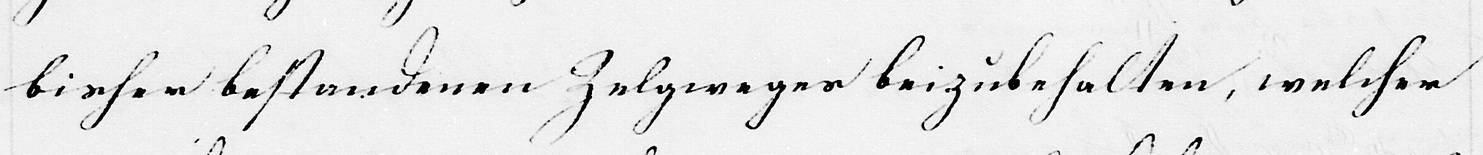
bisher bestandenen Zelgweges beizubehalten, welcher
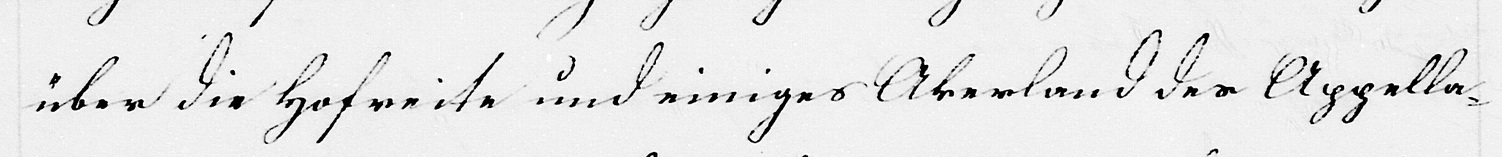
über die Hofreite und einiges Akerland des Appella¬
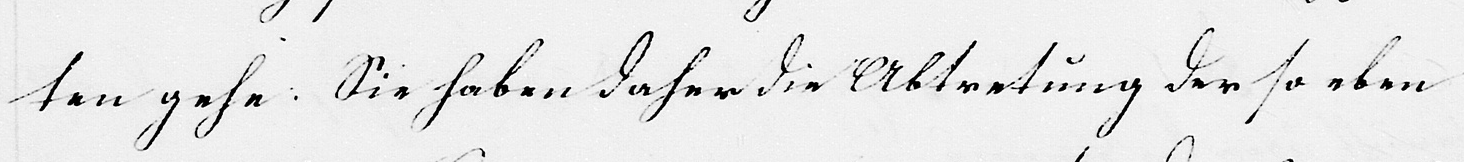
ten gehe. Sie haben daher die Abtretung der so eben
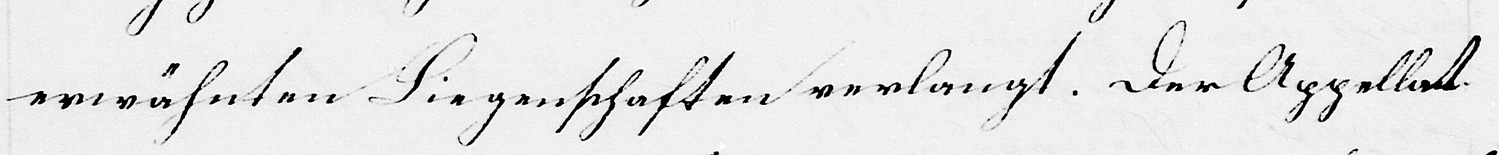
erwähnten Liegenschaften verlangt. Der Appellant
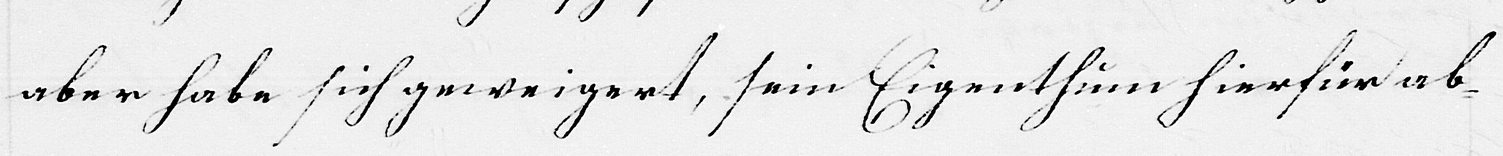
aber habe sich geweigert, sein Eigenthum hierfür ab¬
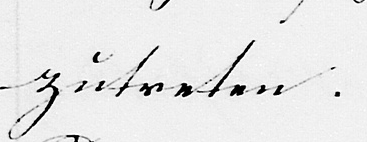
zutreten.
